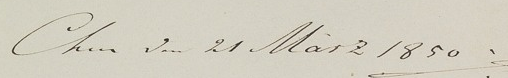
Chur den 21 März 1850.
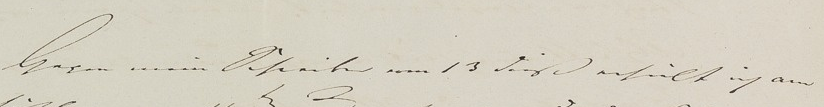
Gegen mein Schreiben vom 13 dieß erhielt ich am
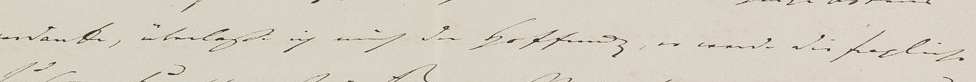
verdanke, überlaße ich mich der Hoffnung, es werde die fragliche
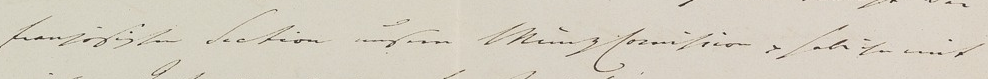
französischen Section unserer Münz Comission & habe ihn mit
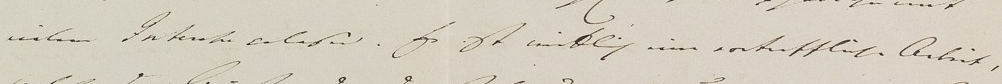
vielem Interesse gelesen. Es ist wirklich eine vortreffliche Arbeit,
